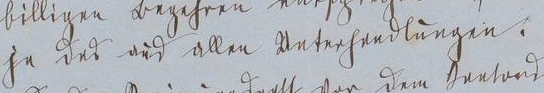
ja das aus allen Unterhandlungen.
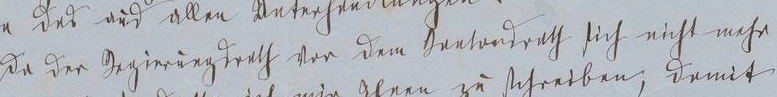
Da der Regierungsrath vor dem Kantonsrath sich nicht mehr
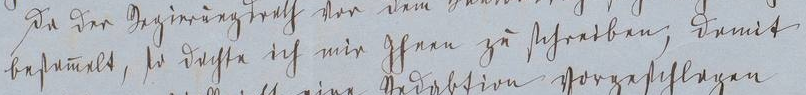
besammelt, so dachte ich mir Ihnen zu schreiben, damit
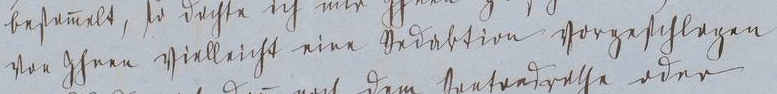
von Ihnen vielleicht eine Redaktion vorgeschlagen
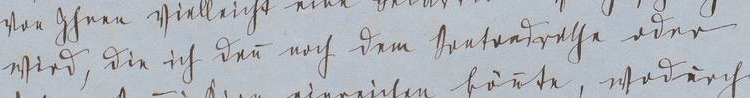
wird, die ich dann noch dem Kantonsrathe oder
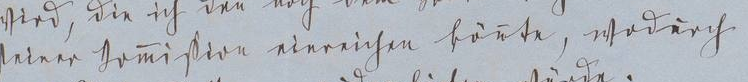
seiner Kommission einreichen könnte, wodurch
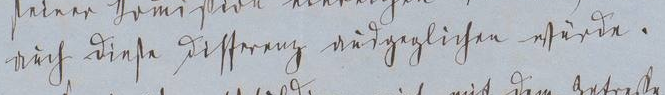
auch diese Differenz ausgeglichen würde.
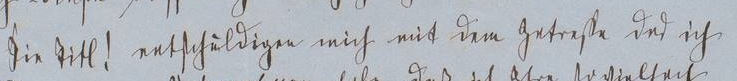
Sie Titl! entschuldigen mich mit dem Intresse das ich
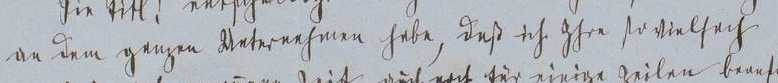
an dem ganzen Unternehmen habe, daß ich Ihre so vielfach
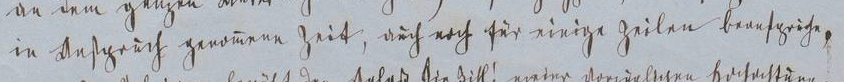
in Ausspruch genommene Zeit, auch noch für einige Zeilen beanspruche.
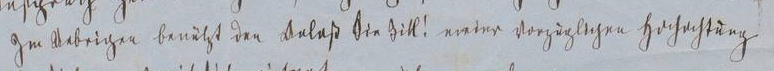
Im Uebrigen benützt den Anlaß Sie Titl! meiner vorzüglichen Hochachtung
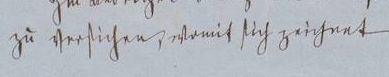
zu versichern, womit sich zeichnet
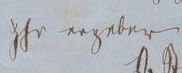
Ihr ergebner
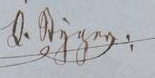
K. Styger
